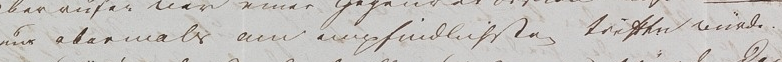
uns abermals am empfindlichsten treffen würde.
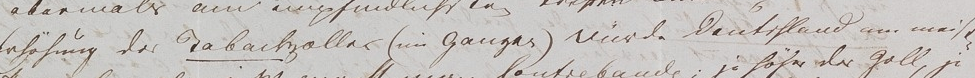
Erhöhung des Tabackzolles (im Ganzen) würde Deutschland am meisten
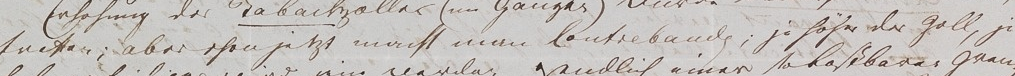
treffen; aber schon jetzt macht man Contrebande; je höher der Zoll, je
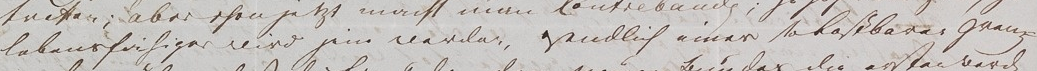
lebensfähiger wird jene werden, & endlich einer so kostbaren Grenz-
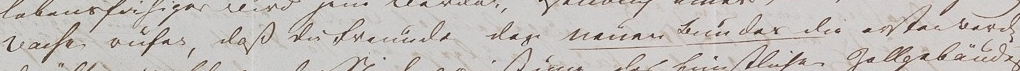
wache rufen, daß die Freunde des neuen Bundes die ersten werden
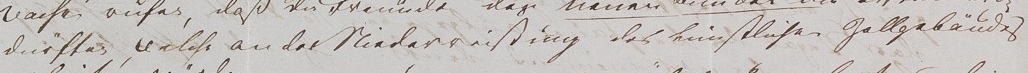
dürften welche an der Niederreißung des künstlichen Zollgebäudes
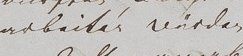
arbeiten würden.
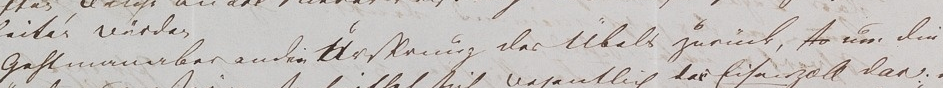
Geht man aber an den Ursprung des Übels zurück, so um die
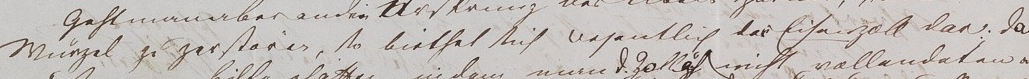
Wurzel zu zerstören, so biethet sich wesentlich der Eisenzoll dar. Da
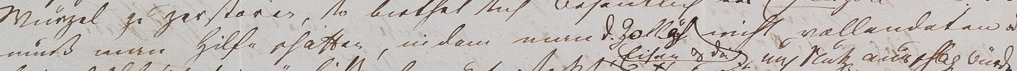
muß man Hilfe schaffen, indem man d. Zoll auf Eisen & den nicht vollendeten
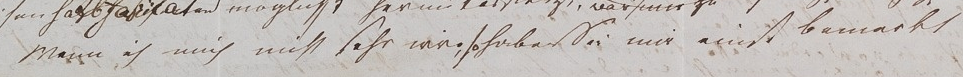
Wenn ich mich nicht sehr irre, so haben Sie mir einst bemerkt
